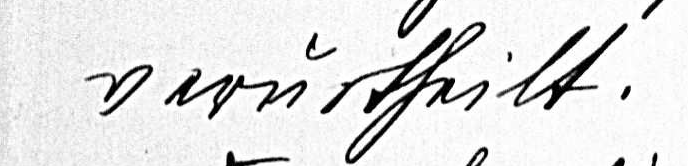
verurtheilt.
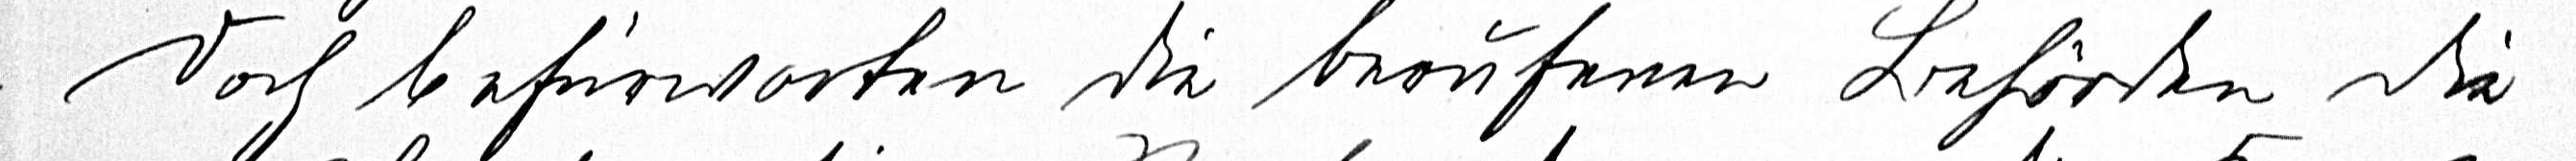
Doch beürworten die berufenen Behörden die
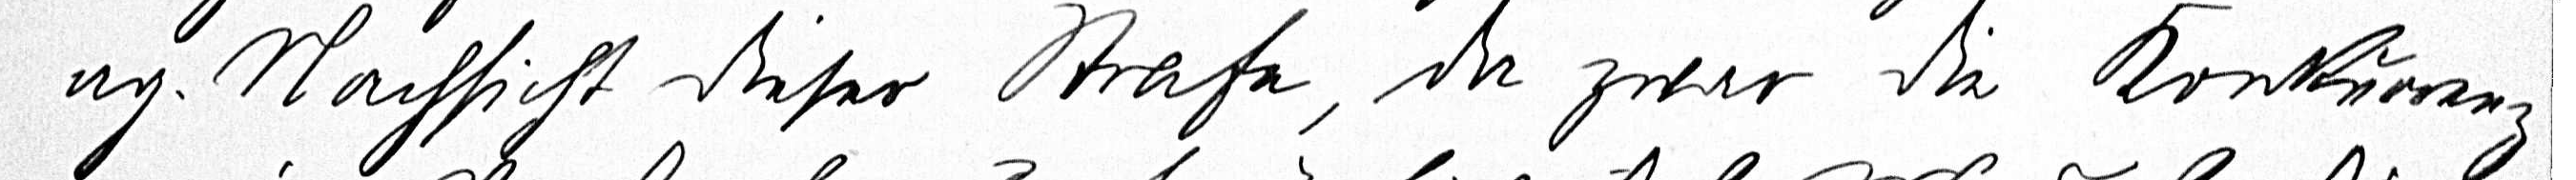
ag. Nachsicht dieser Strafe, da zwar die Konkurrenz
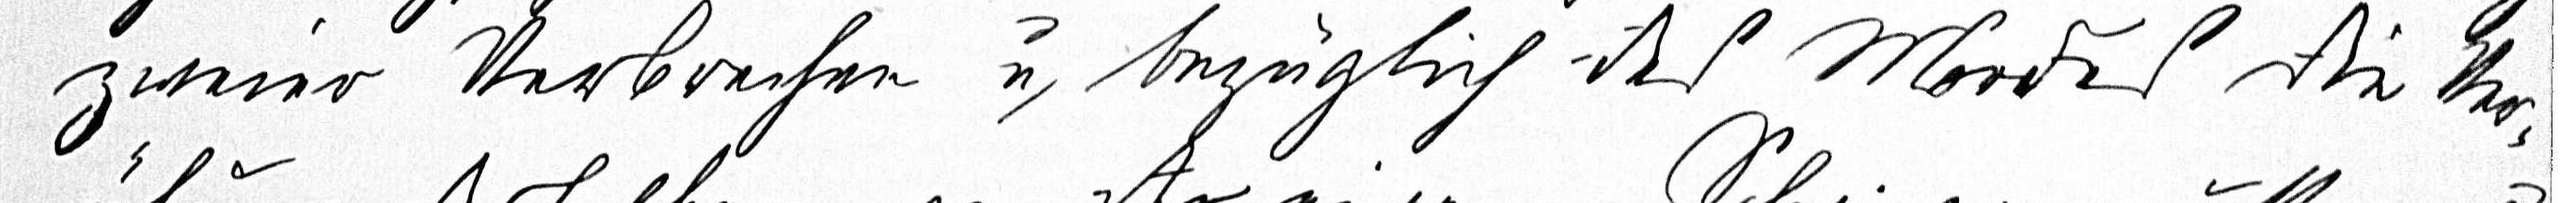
zweier Verbrechen u. bezüglich des Mordes die Ver¬
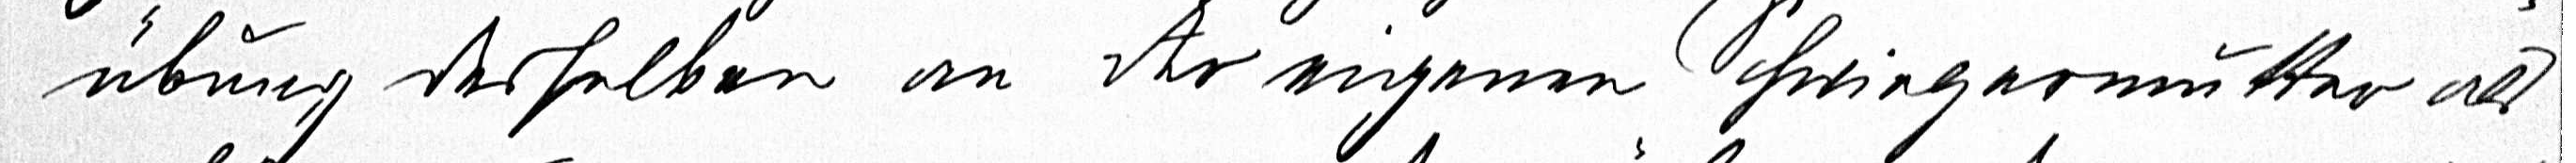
übung desselben an die eigenen Schwiegermutter als
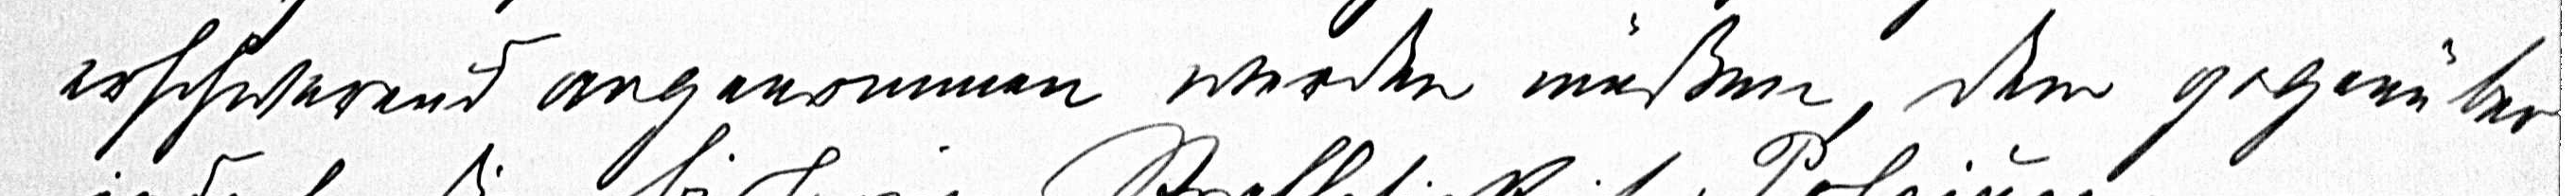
erschwerend angenommen werden müßen, den gegenüber
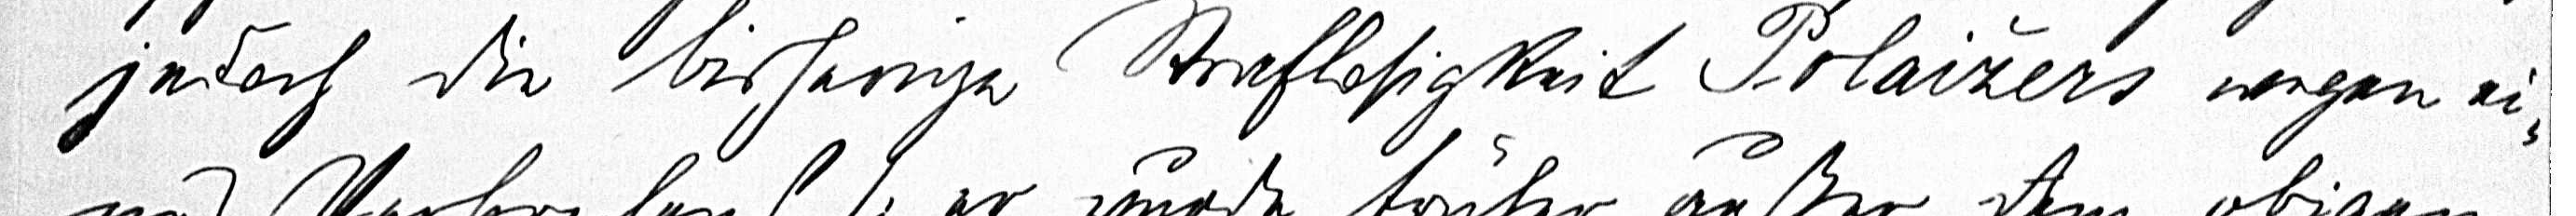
jedoch die bisherige Straflosigkeit Polaižers wegen ei¬
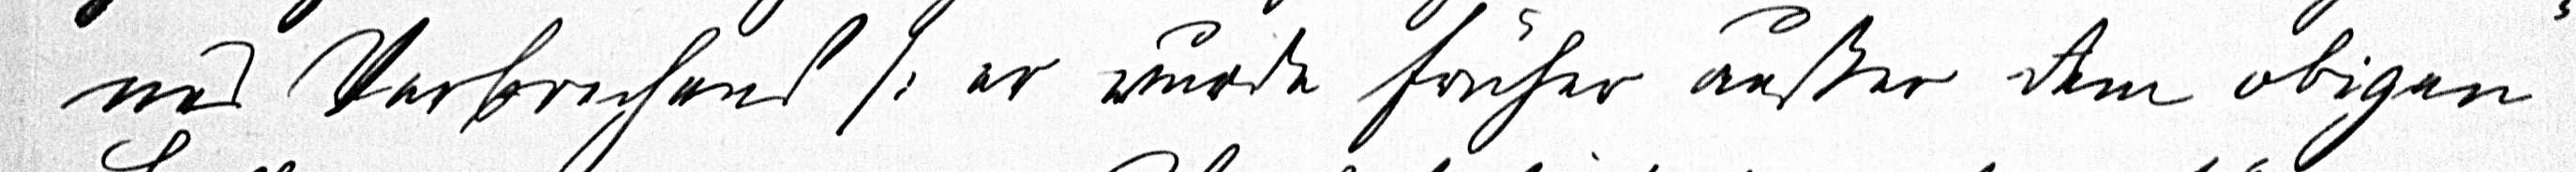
nes Verbrechens (er wurde früher außer dem obigen
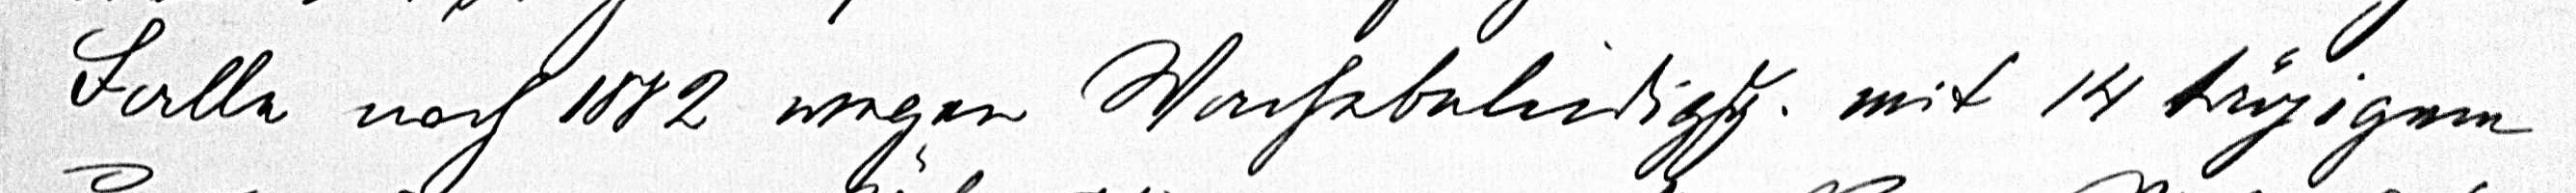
Falle noch 1882 wegen Wachebeleidigung imt 14 tägigen
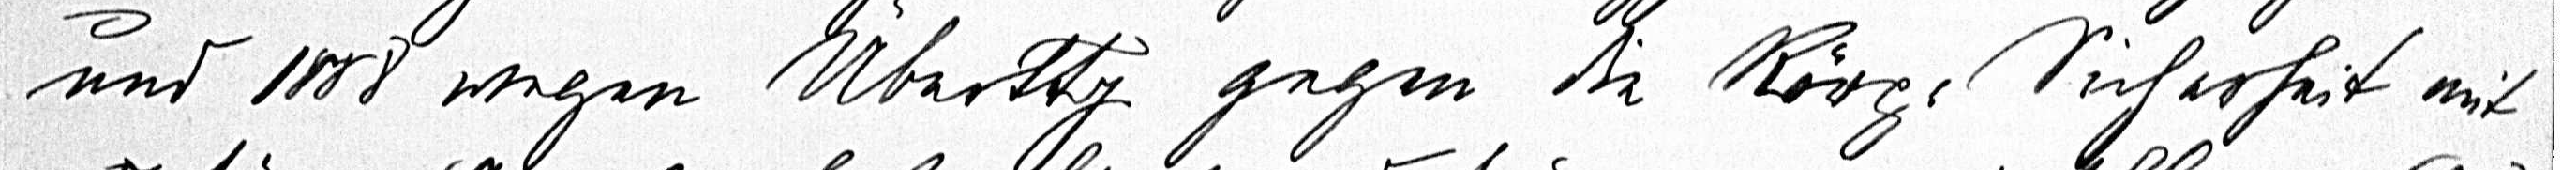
und 1888 wegen Überttg gegen die Körp. Sicherheit mit
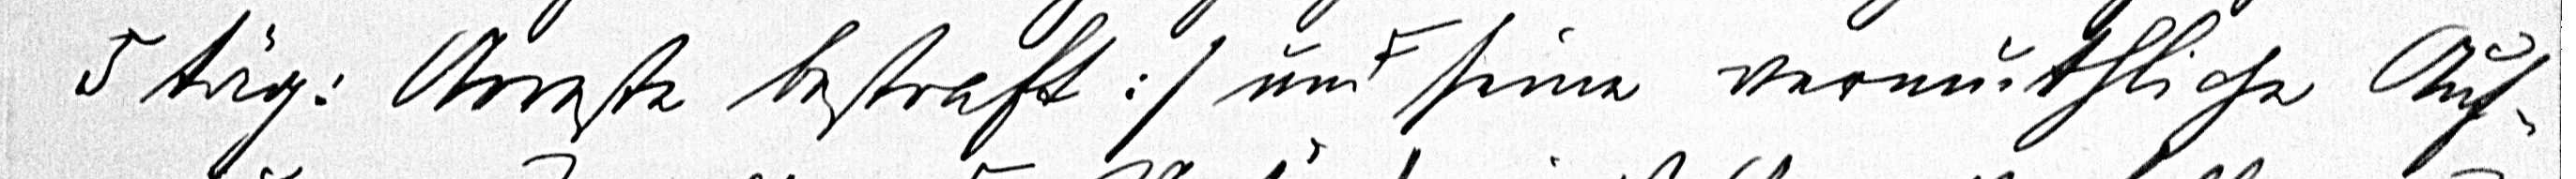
5 täg. Arreste bestraft) und seine vermuthliche Auf¬
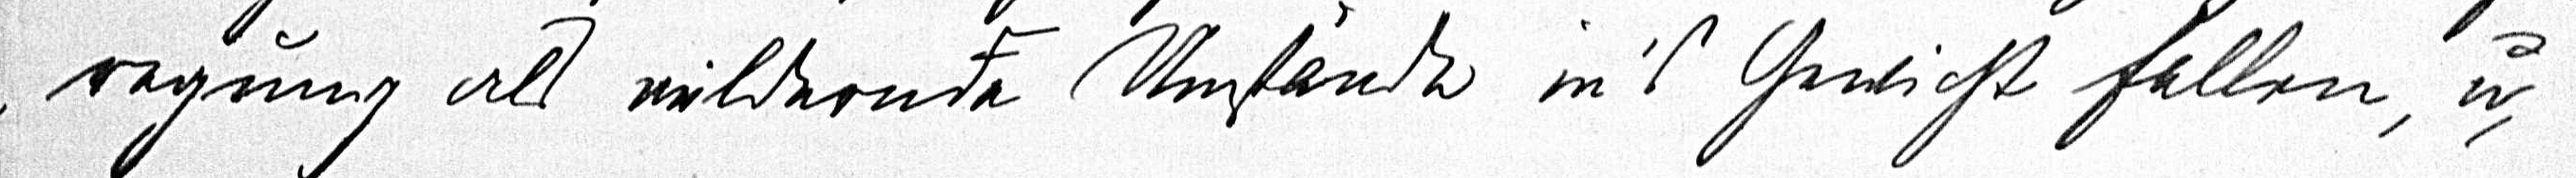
regung als mildernde Umstände in’s Gewicht fallen, u.
